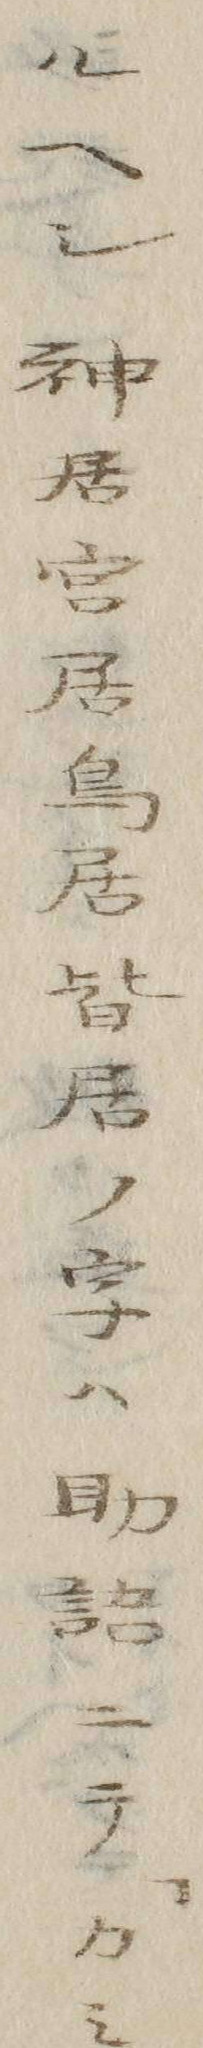ルヘシ神居宮居鳥居皆居ノ字ハ助語ニテ「カミ
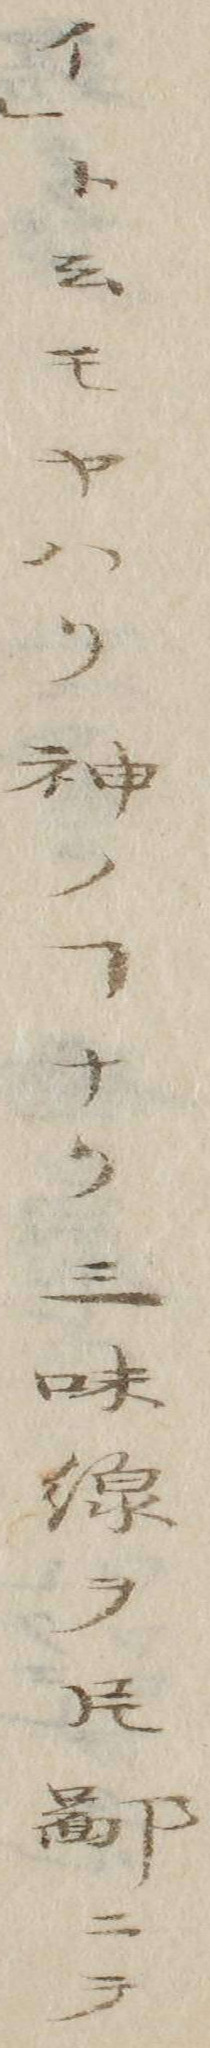イ」ト云モヤハリ神ノコトナリ三味線ヲ片鄙ニテ
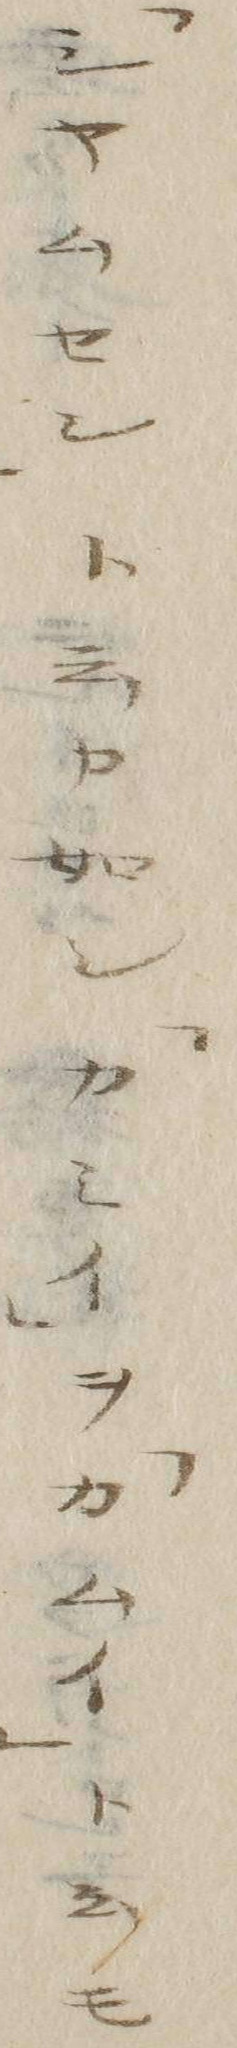「シヤムセン」ト云カ如シ「カミイ」ヲ「カムイ」ト云モ
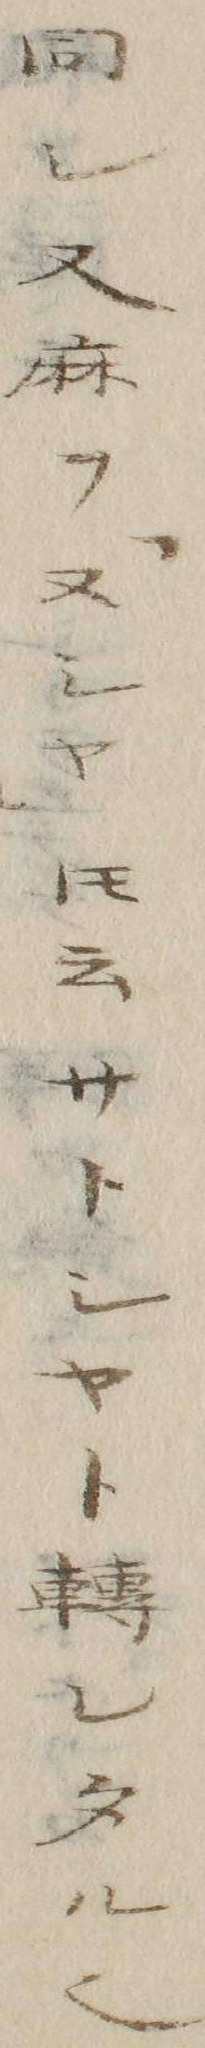同シ又麻ヲ「ヌシヤ」トモ云サトシヤト転シタル也
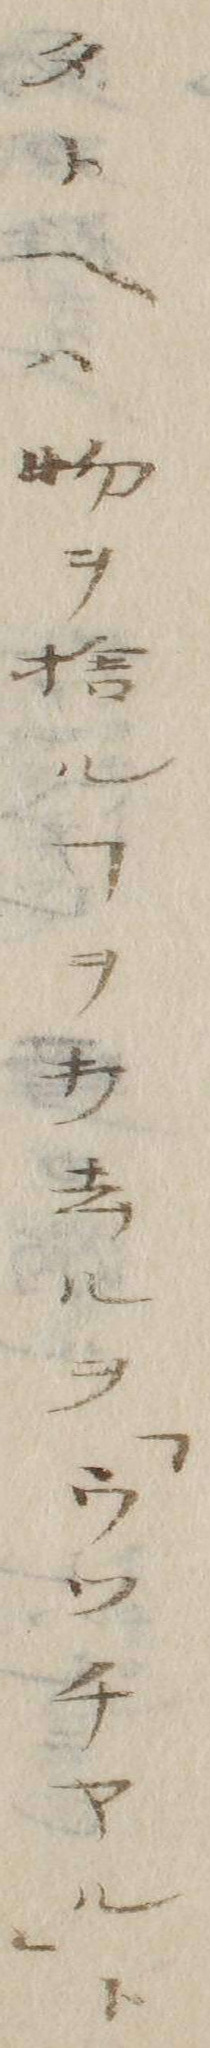タトヘハ物ヲ捨ルコトヲ打去ルヲ「ウツチヤル」ト
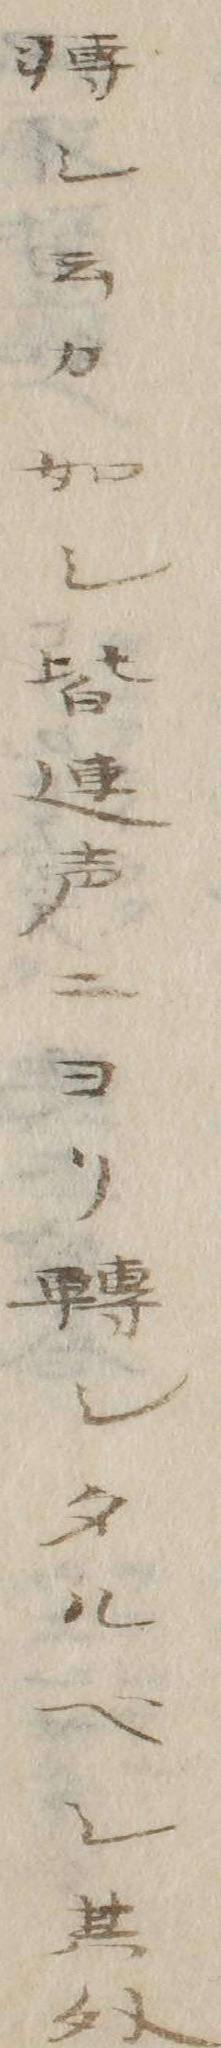転シ云カ如シ皆連声ニヨリ転シタルベシ其外
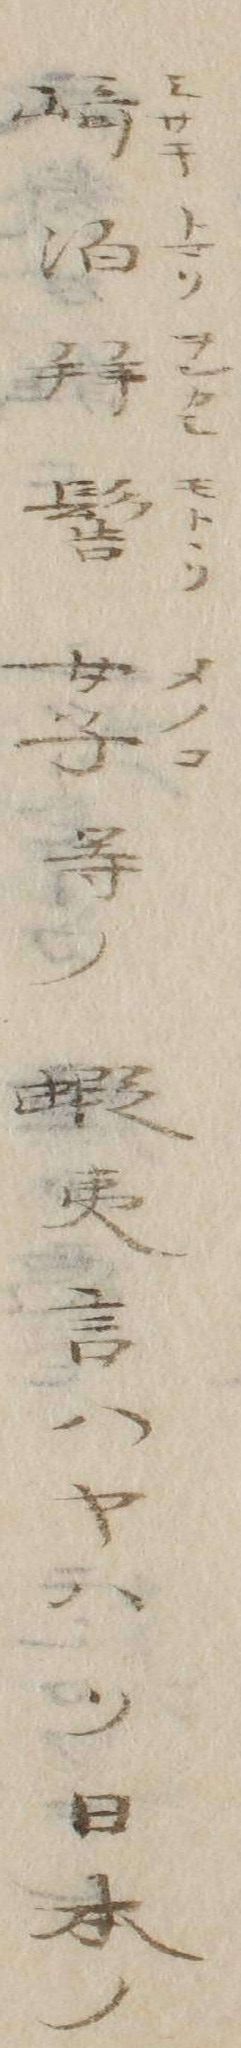崎泊拝髻女子等ノ蝦夷言ハヤハリ日本ノ
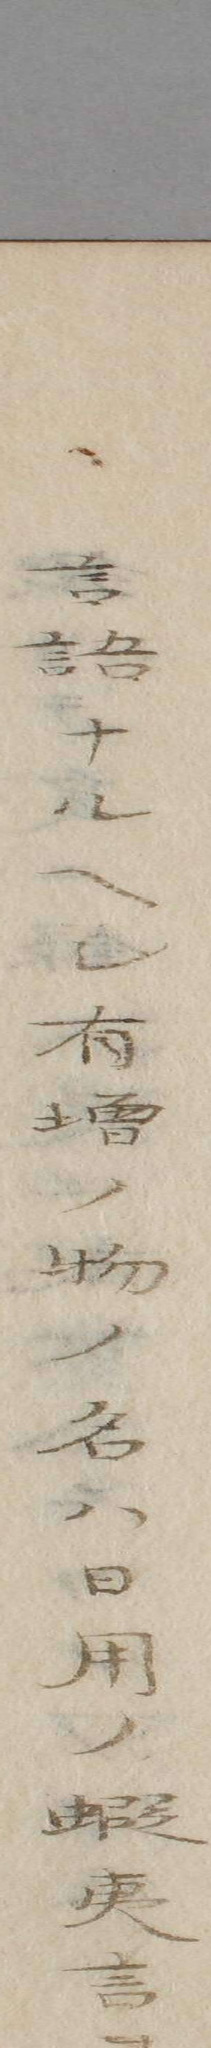言語ナルヘシ有増ノ物ノ名ハ日用ノ蝦夷言ヲ
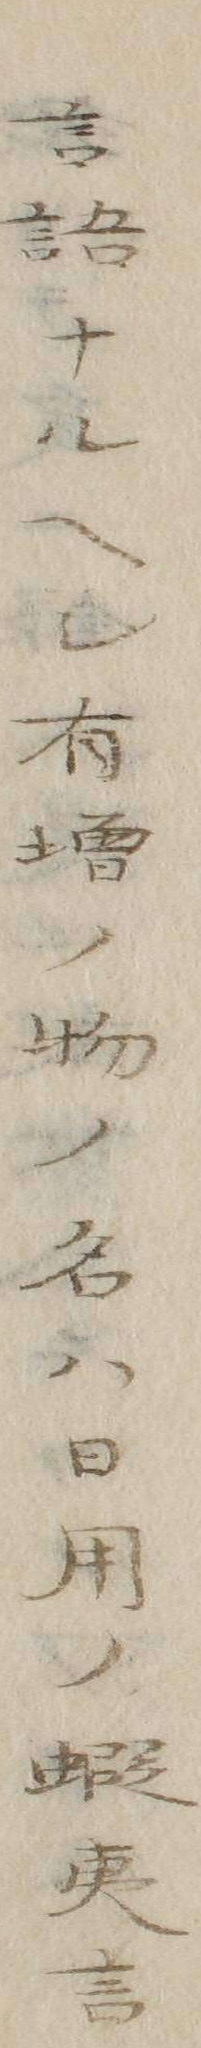言語ナルヘシ有増ノ物ノ名ハ日用ノ蝦夷言ヲ

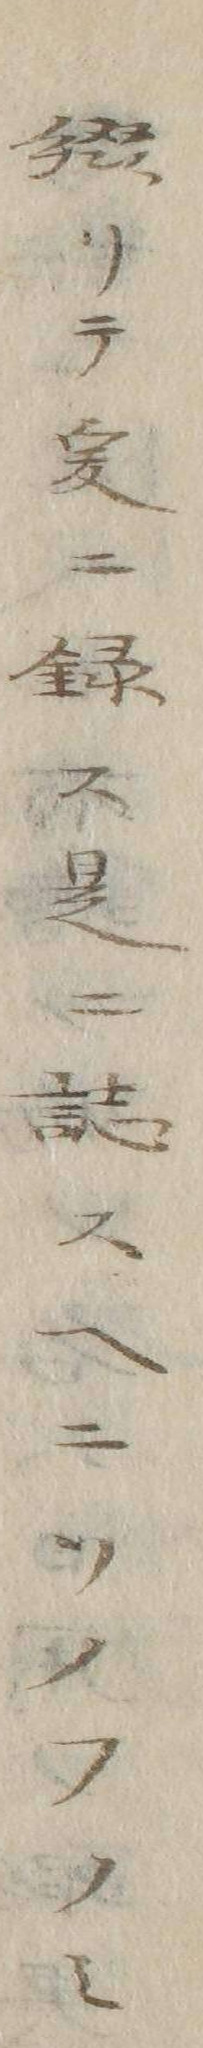綴リテ爰ニ録ス是ニ誌スヘニソノフノミ
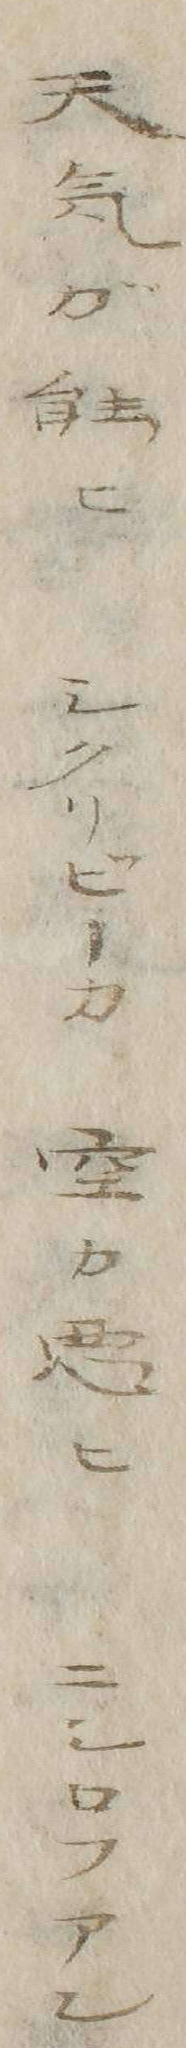天気カ能ヒシクリビーカ空カ悪ヒニシロフアン
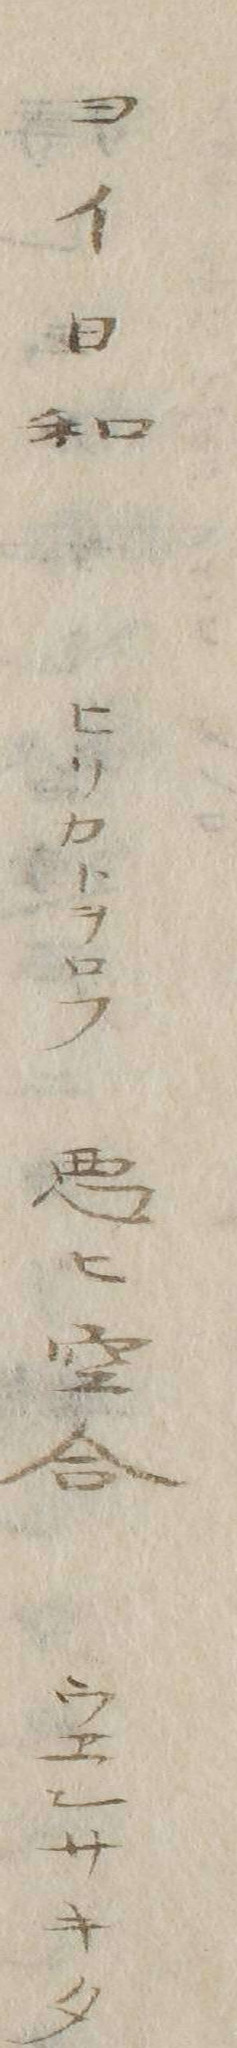ヨイ日和ヒリカトヲロフ悪ヒ空合ウヱンサキタ
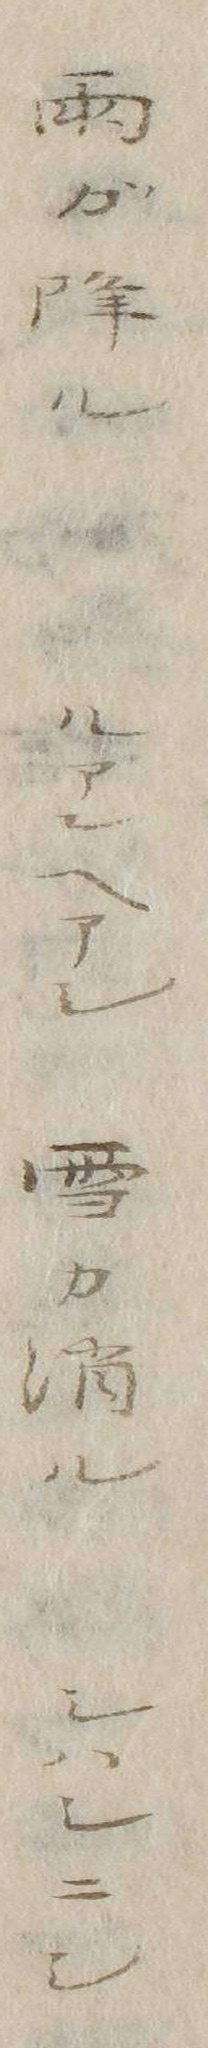雨ガ降ルルアンヘアン雪カ消ルシハレニシ
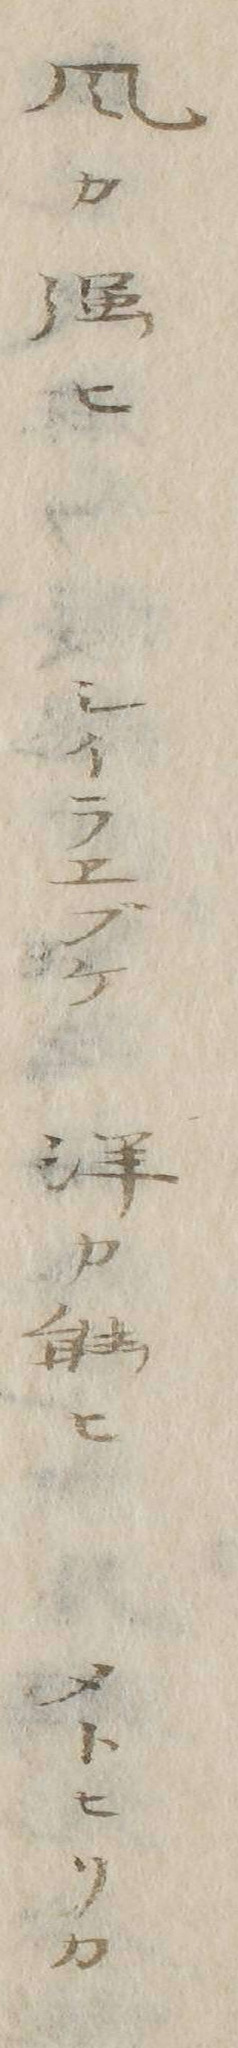風カ強ヒシイラヱブケ洋カ能ヒメトヒリカ
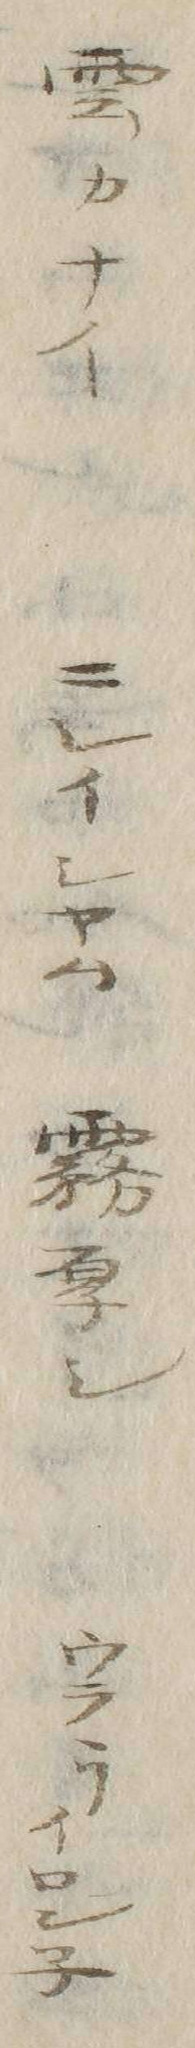雲カナイニシイシヤム霧厚シウラライロン子
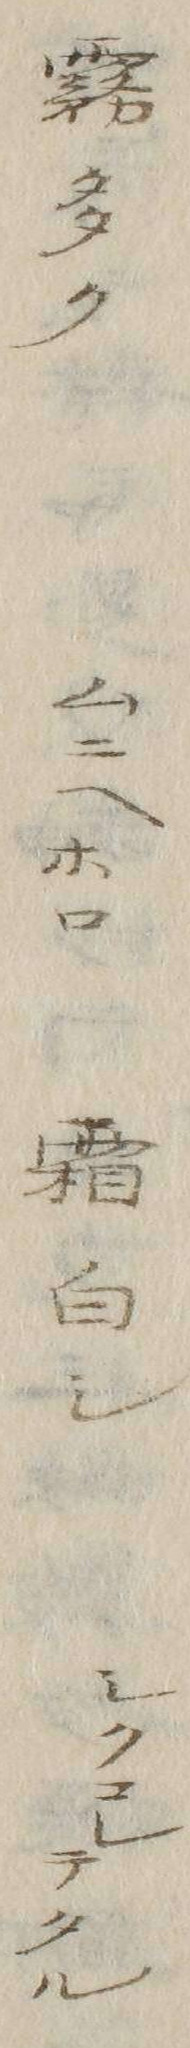霧多クムニヘホロ霜白シシクコレテタル
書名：蝦夷草紙（国文学研究資料館）
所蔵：国文学研究資料館
